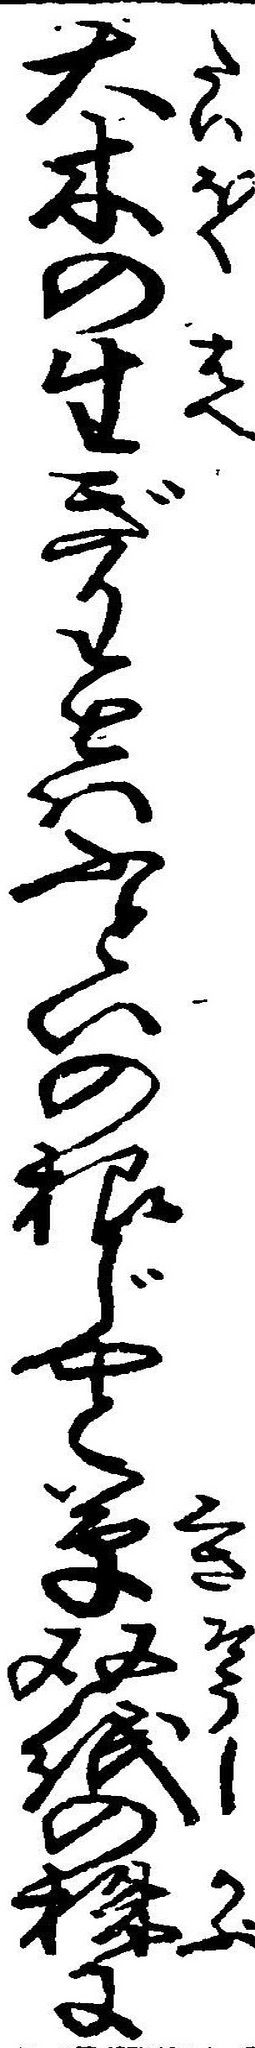大木の生ぎわとはふといの根じやと草双紙の株に
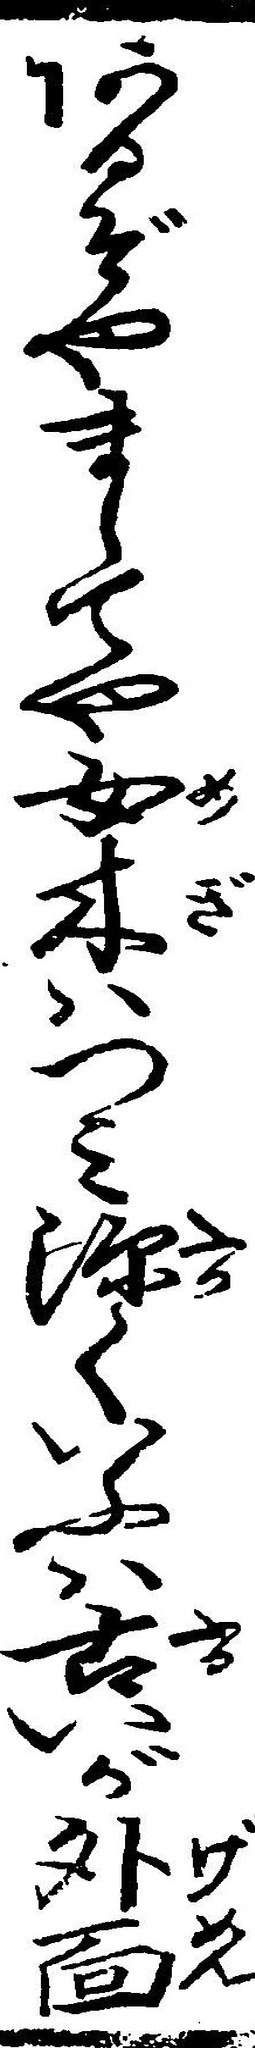あるぞやましてや女木はつみ深くいふは古いが外面
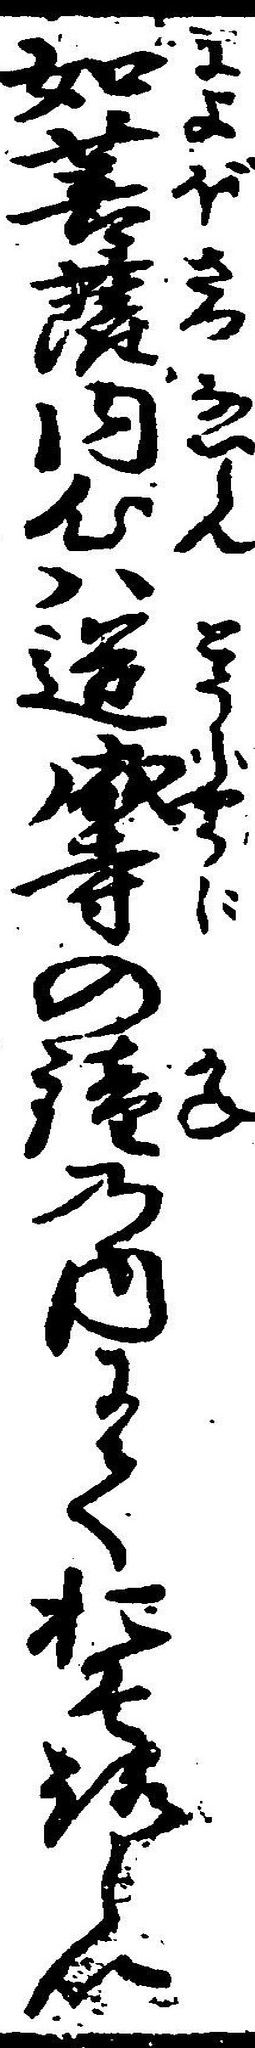如菩薩内心は道成寺の鐘の内にておそろしい
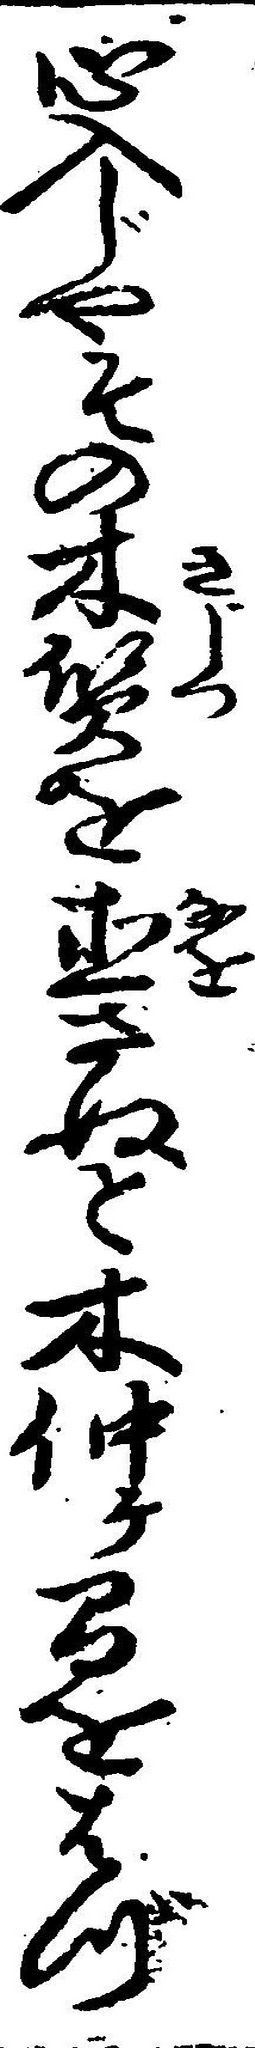心入じやその木質を直さぬと木仲ヶ間をはづ
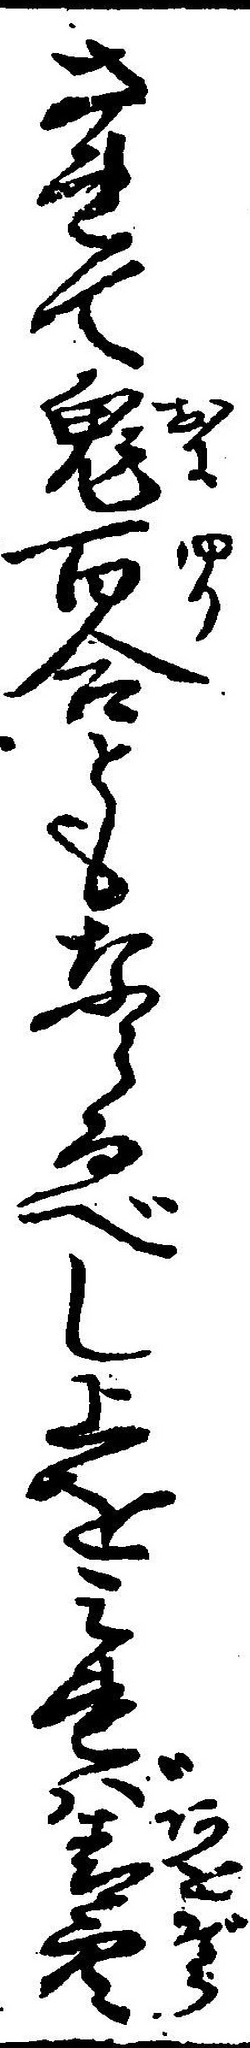されて鬼百合ともならるべし上をみれば青空
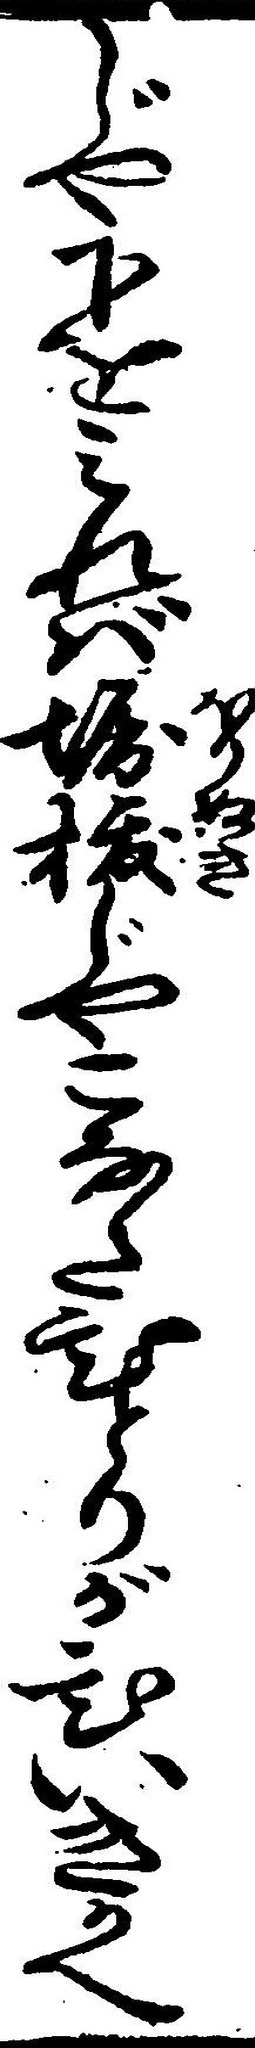じや下をみれば掘抜じやこなたひとりがひいきかへ
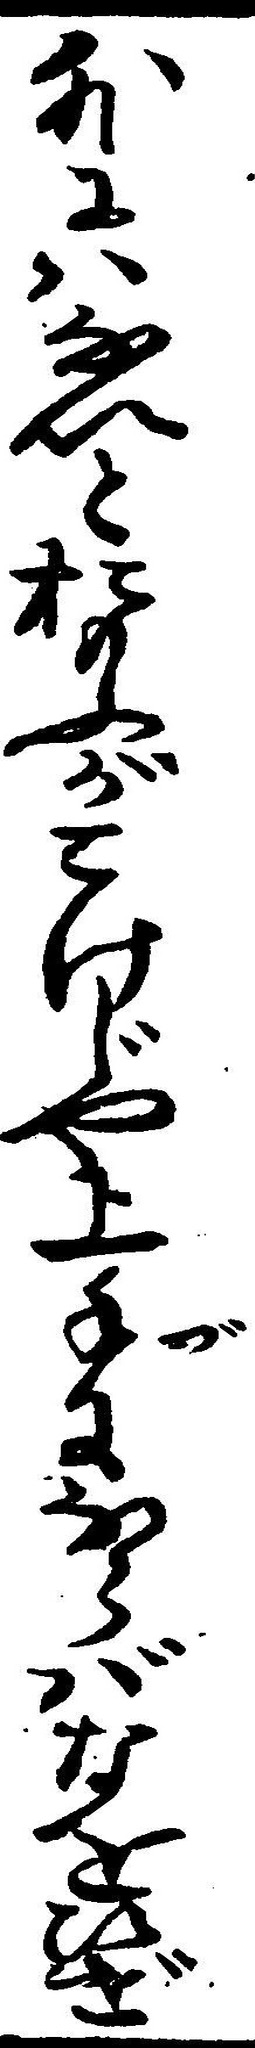外にはないとおもふがこけじや上手にならばなをひげ
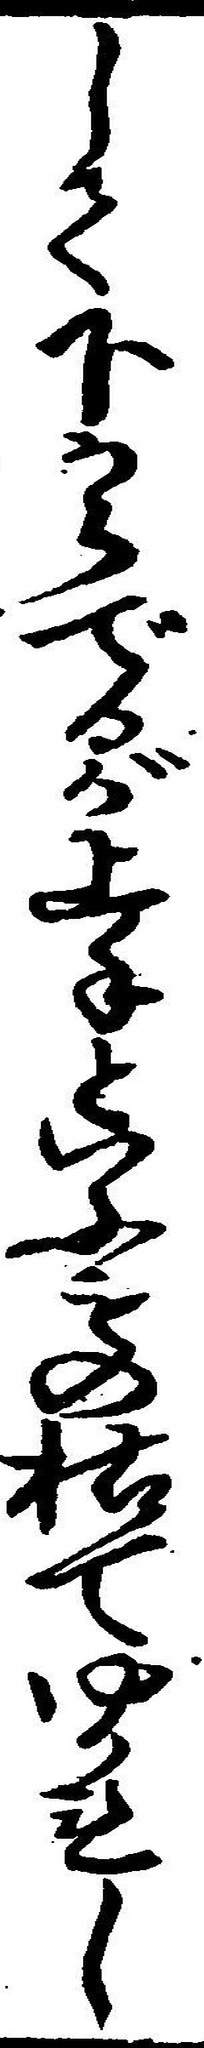して下からでるが上手といふもの枯てゆかれし
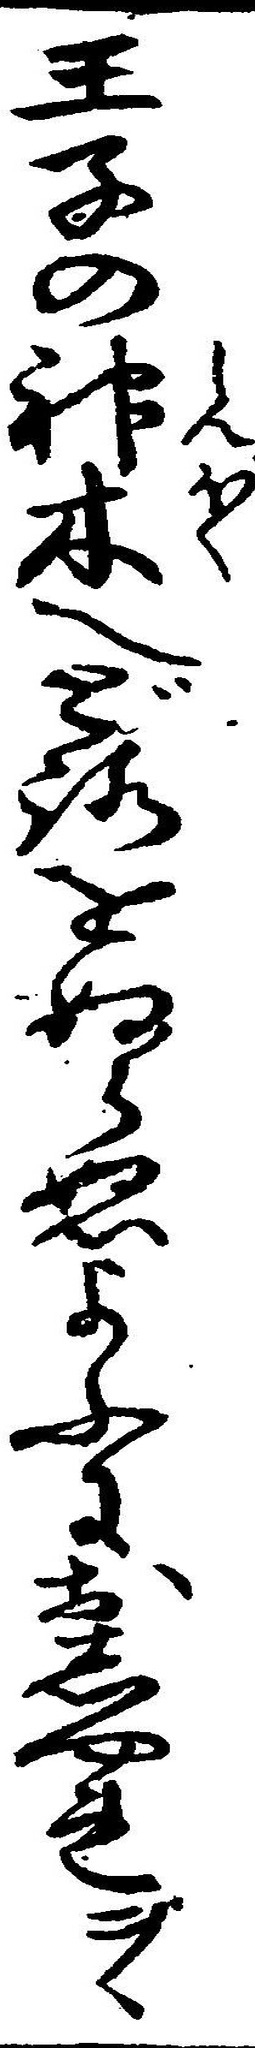王子の神木へどろをぬらぬよふにおしやれヲヽ

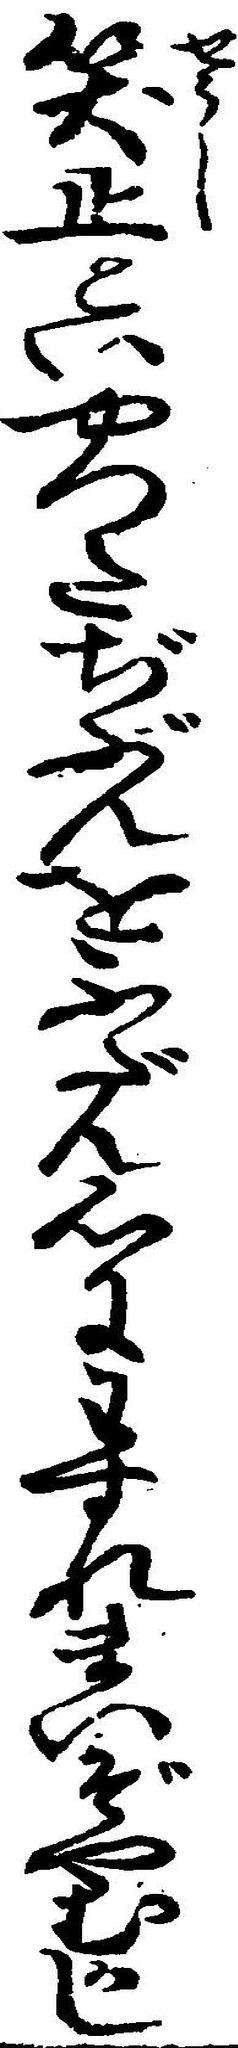笑止といやつたぢぶんをふだん心にわすれまいぞやむかし
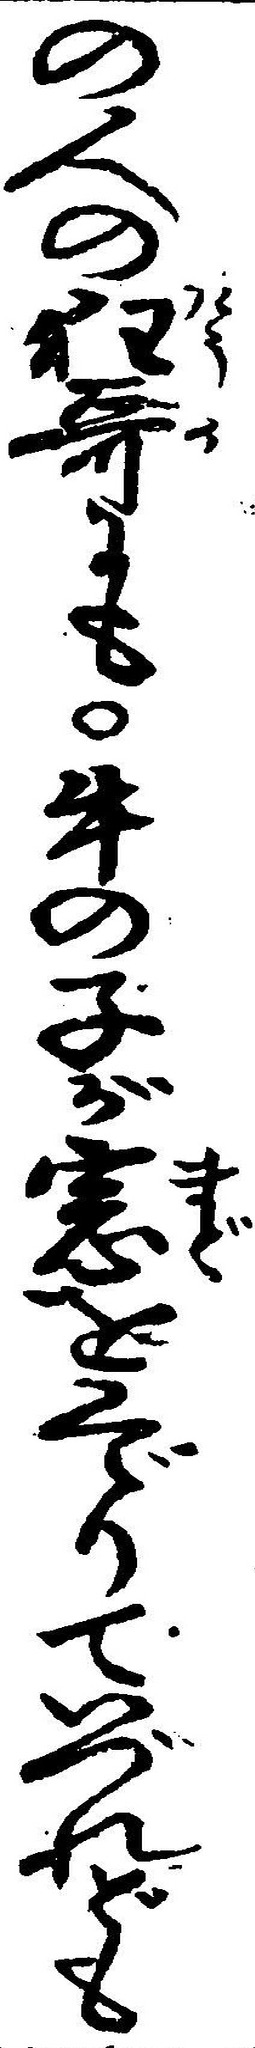の人の狂歌にも○牛の子が窓をくゞりていづれども
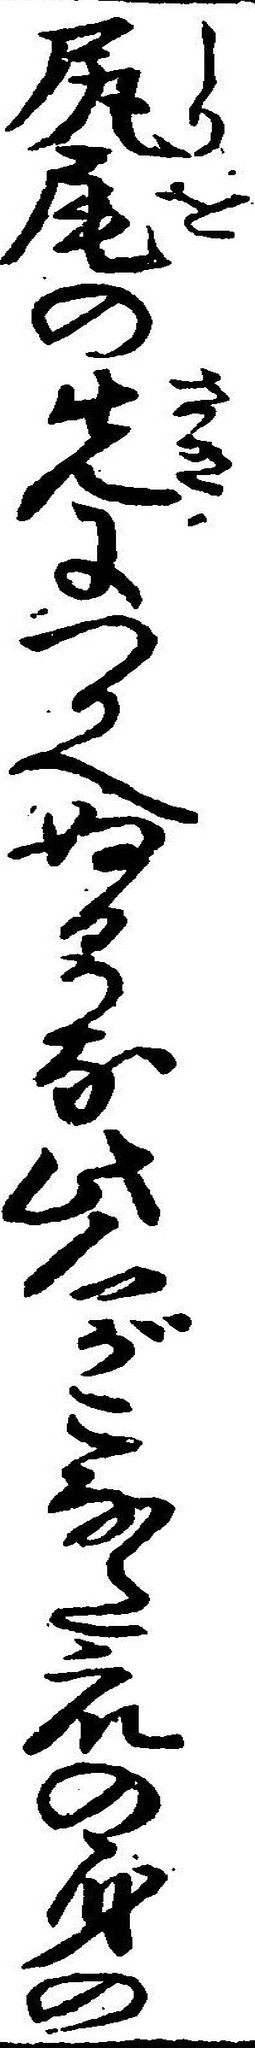尻尾の先につかへぬるかな此心がこなた衆の身の
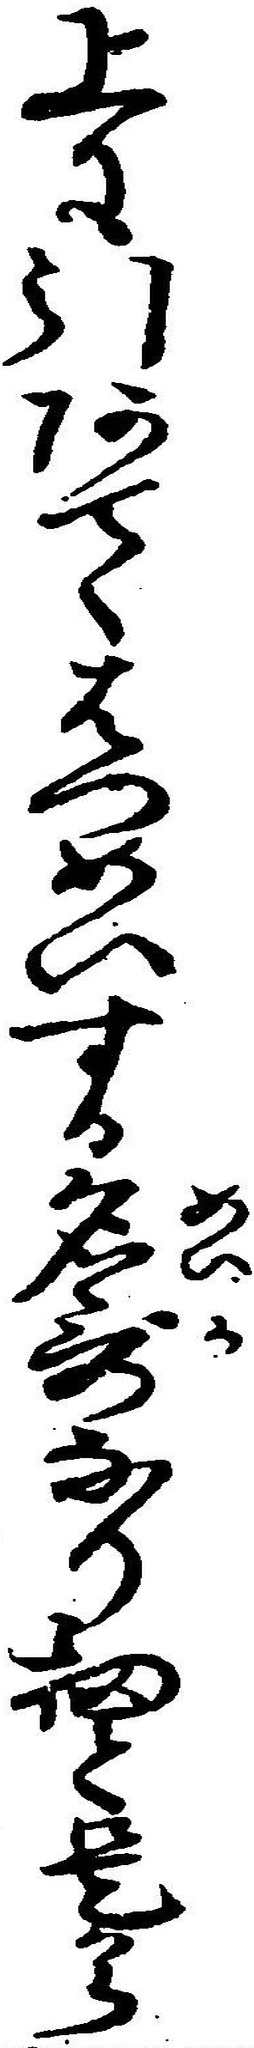上に引あてゝはつめいする名歌なり扨と是から
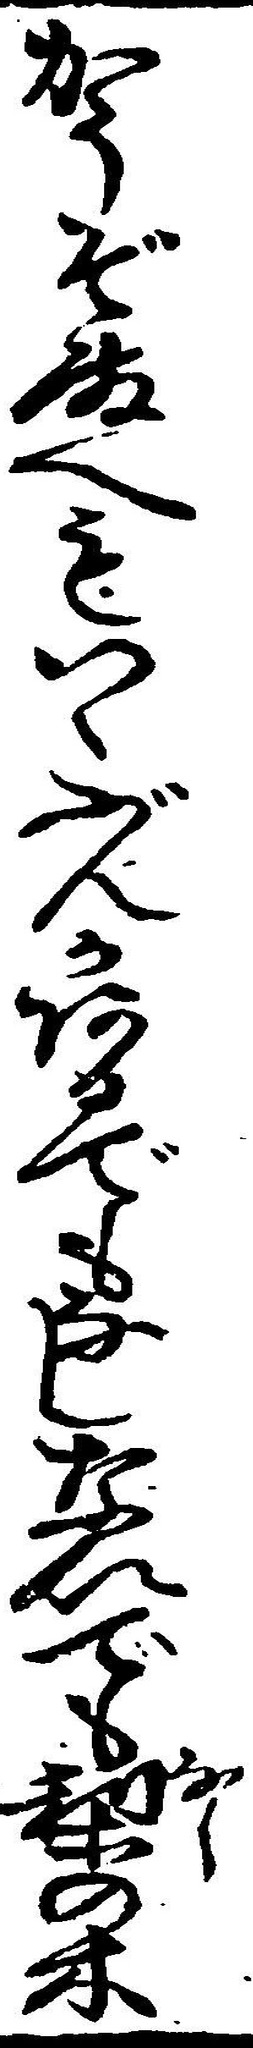かうぞ殿へもいゝぶんあるでもなしないでも梨の木
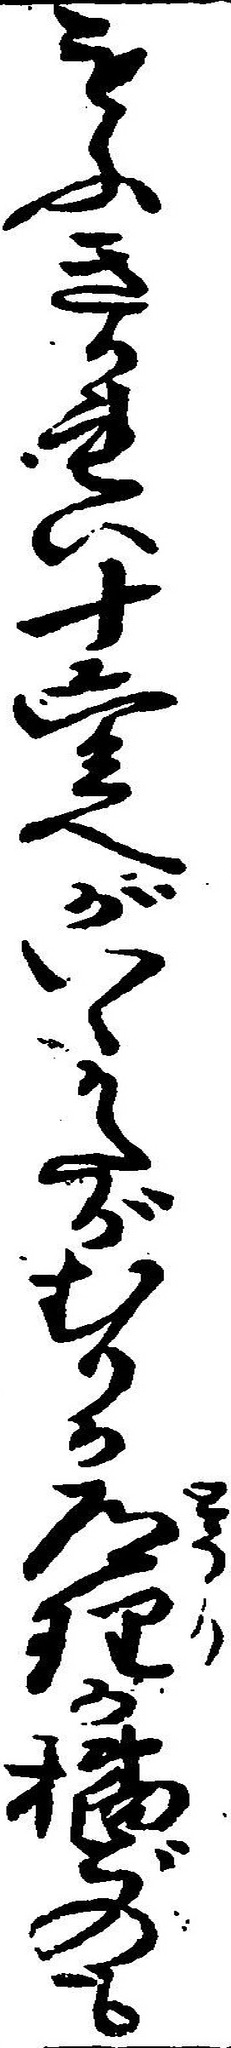もふきかれは十六兵衛がいゝかたがむりか道理か橘どのも
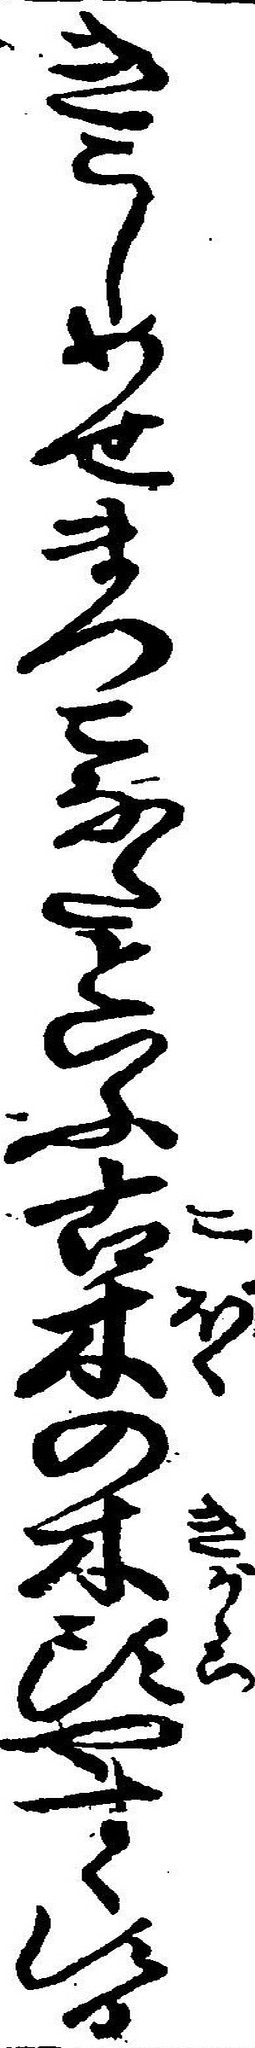きこしめせまつこなたといふ古木の木頭やすくする
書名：草木芝居化物退治 / 泉花堂三蝶(十六兵衛)作
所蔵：東京大学総合図書館 General Library in the University of Tokyo, JAPAN
